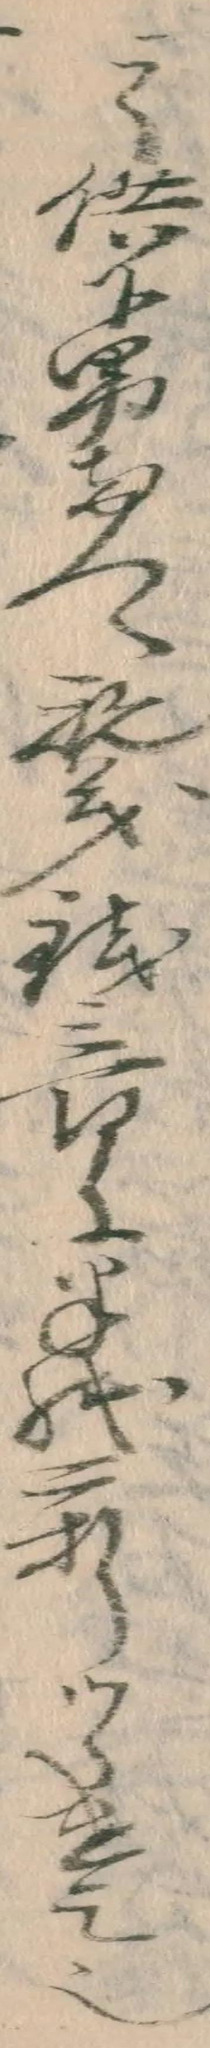之供下男両人へ祝義銭三百文半紙二折ツヽ遣也
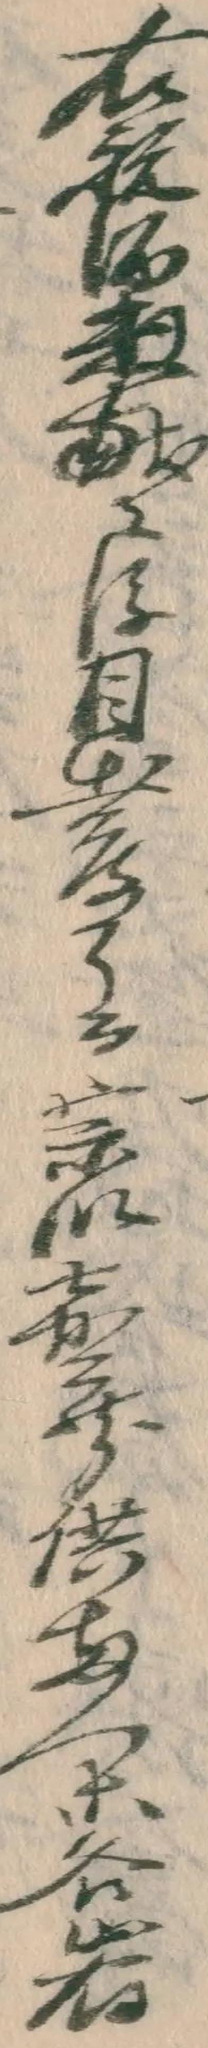右祝酒数献之後目出度了而ハ宗以嘉蔵供両人等各宿
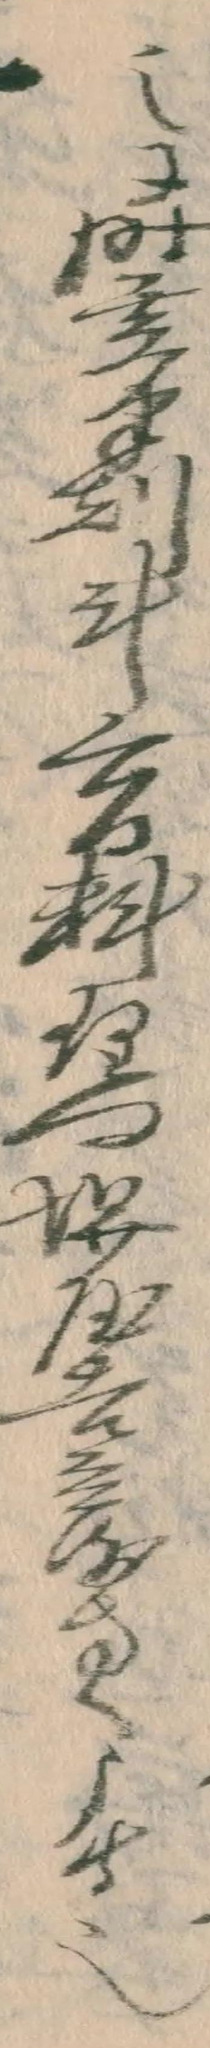也于時亥半刻斗今日料理向堺屋吉兵衛方へ申付也
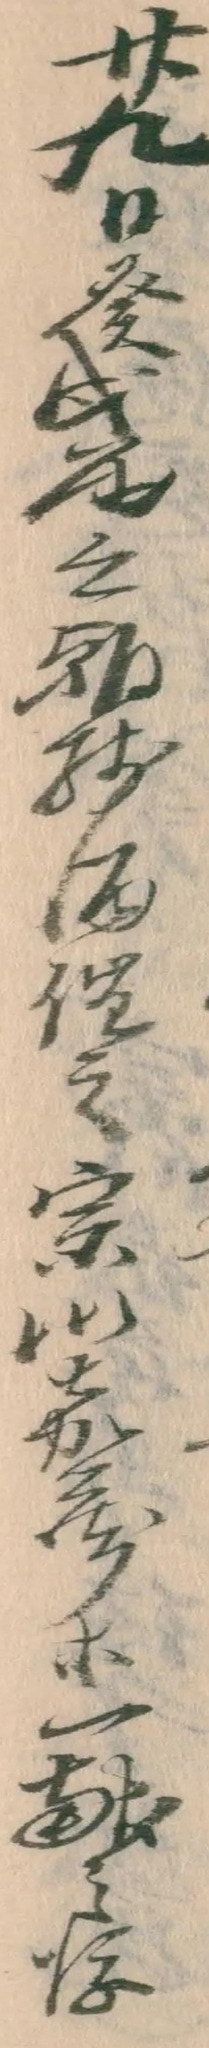廿九日癸戌雨今朝残酒催也宗以嘉蔵等一献之後
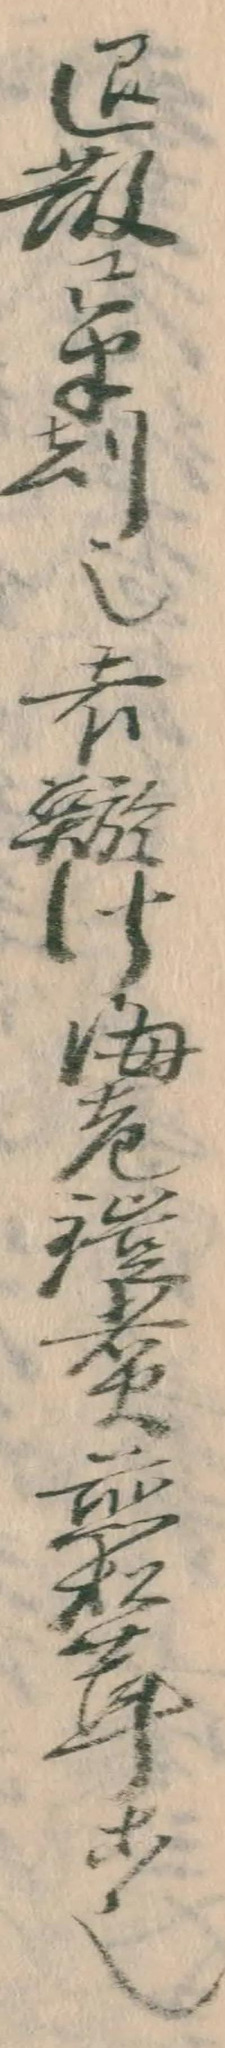退散巳半刻也肴鮨汁海老鎧煮煎煎松茸等也
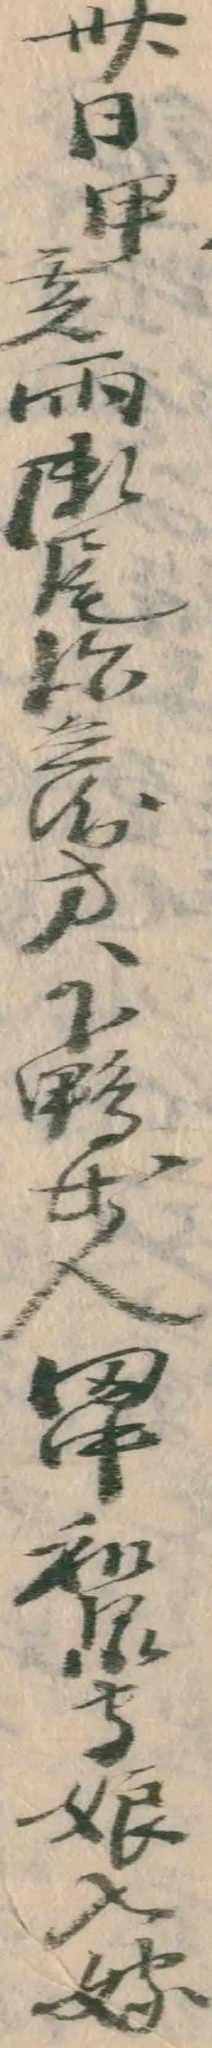卅日甲亥雨瀬尾弥兵衛方へ下鴨氏人田中和泉守娘入嫁
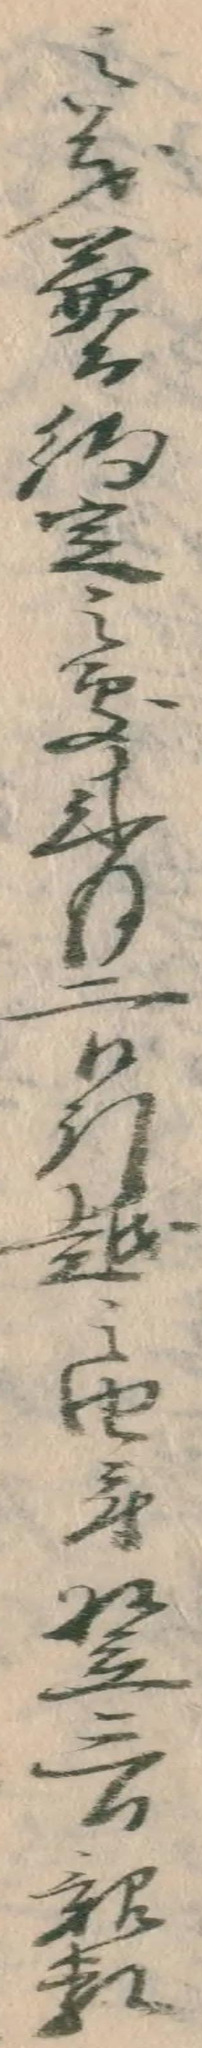之義兼而約定之處来月二日引越之由ニ付翌三日親類
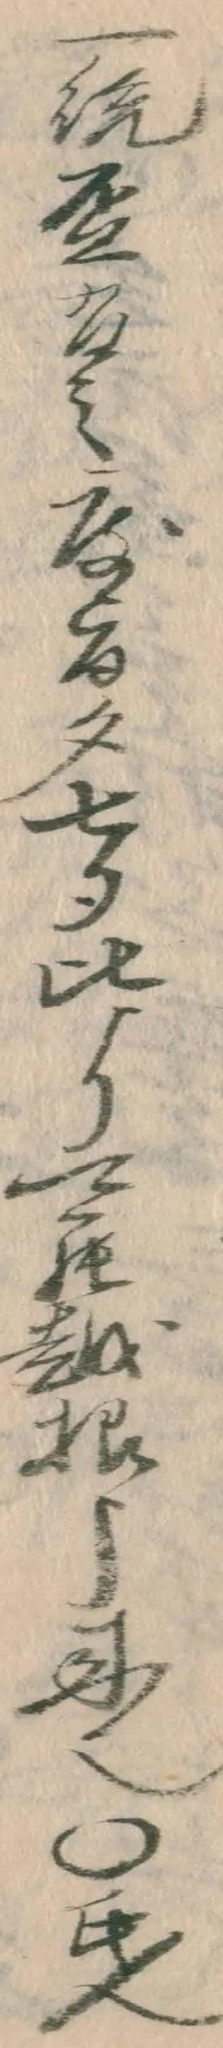一統盃有之度旨夕七ッ比より可罷越様申来也○氏人
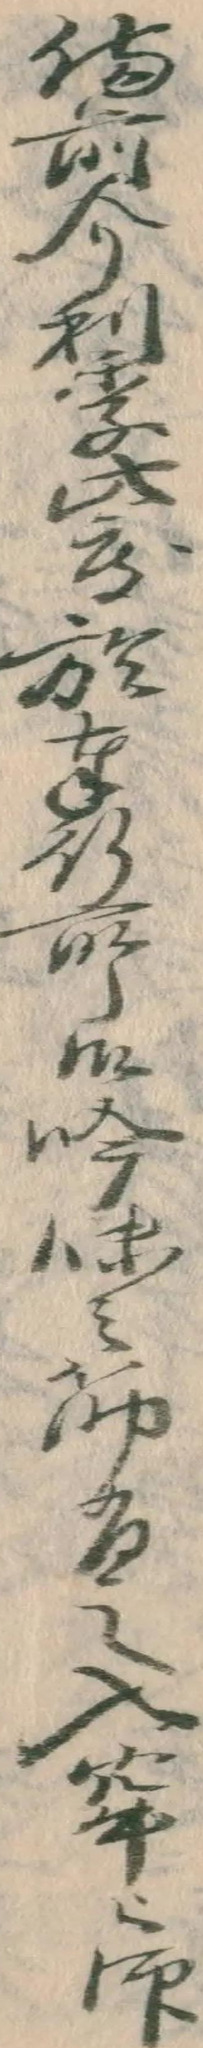備前介利季此度於奉行所御吟味之節有之入牢被仰
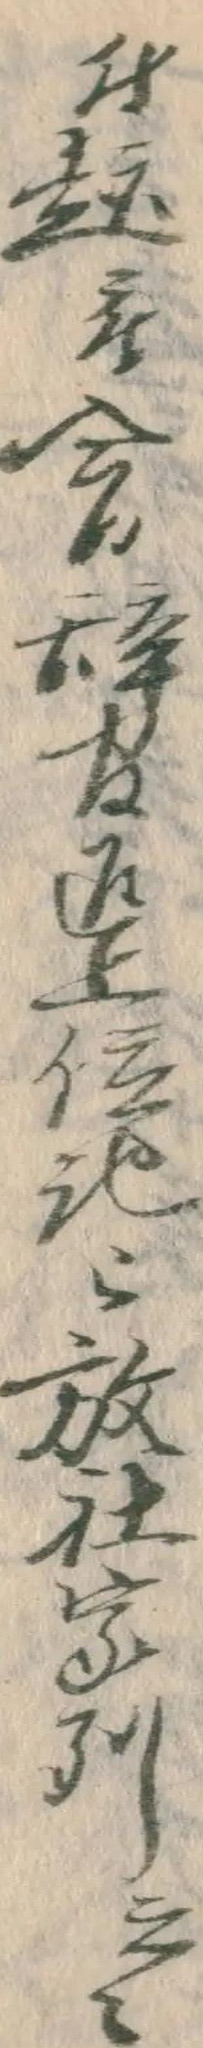付趣ニ付今日辞官返上位記被放社家列云々
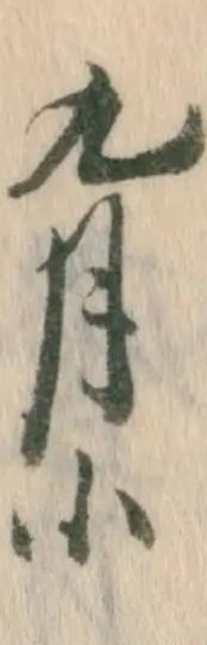九月小
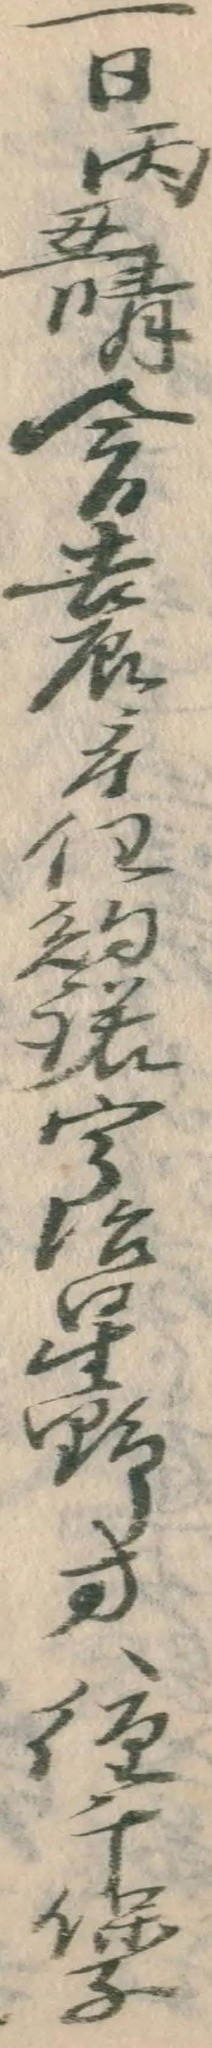二日丙丑晴今日吉辰に付任約諾宇治星野方へ経千保子
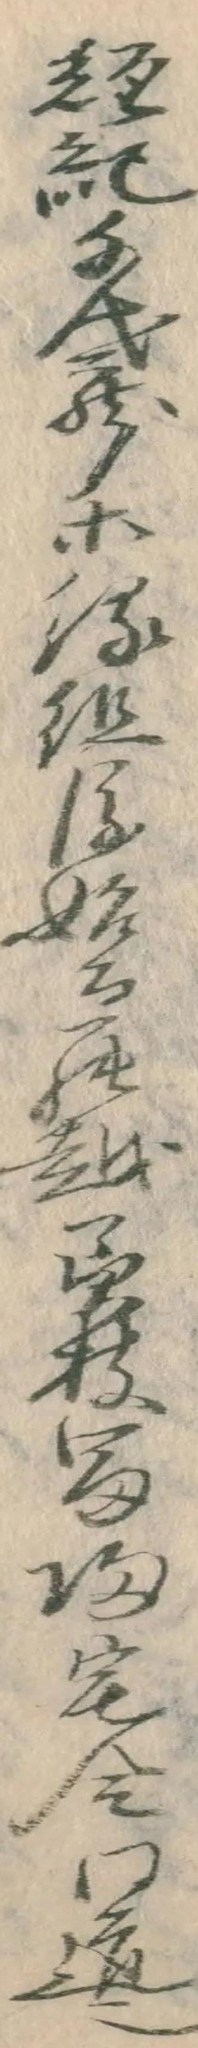経紀千代蔵等縁組後始而罷越美枝冨帰宅令同道也
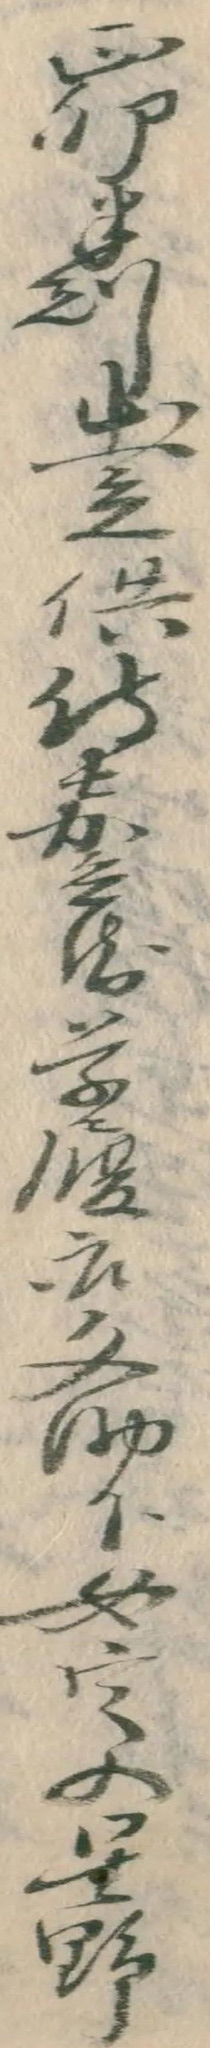正卯半刻出立供侍嘉兵衛草履取文助下女うの星野
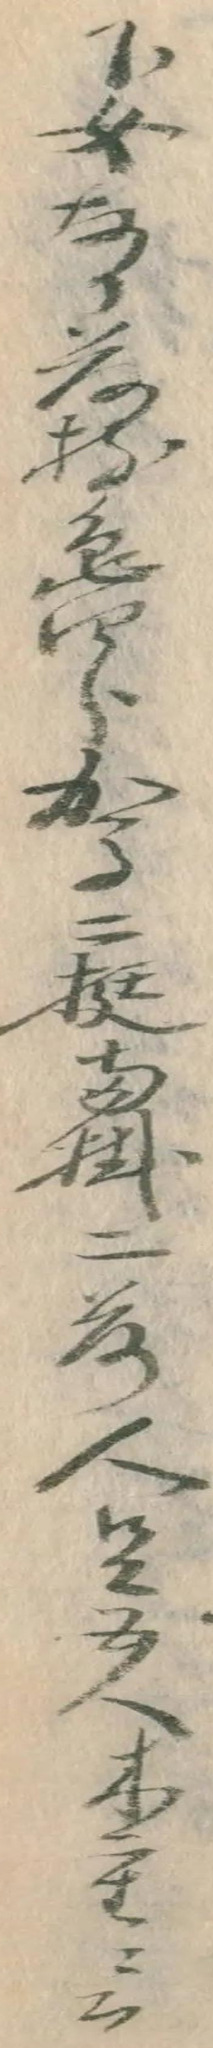下女なか荷持亀四郎駕二挺両掛二荷人足五人木重ニ而

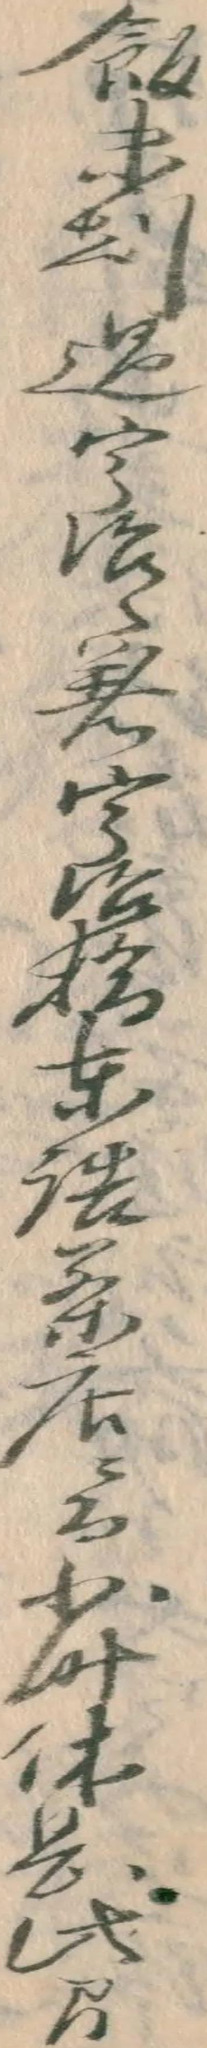飯未刻過宇治へ着宇治橋東詰茶店ニ而小時休息此間
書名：賀茂社記録. 第67冊
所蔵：国立国会図書館 National Diet Library, JAPAN
